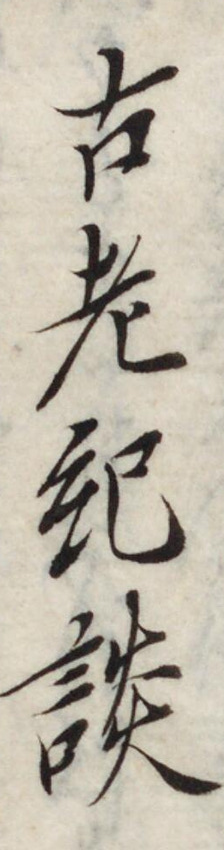古老紀談

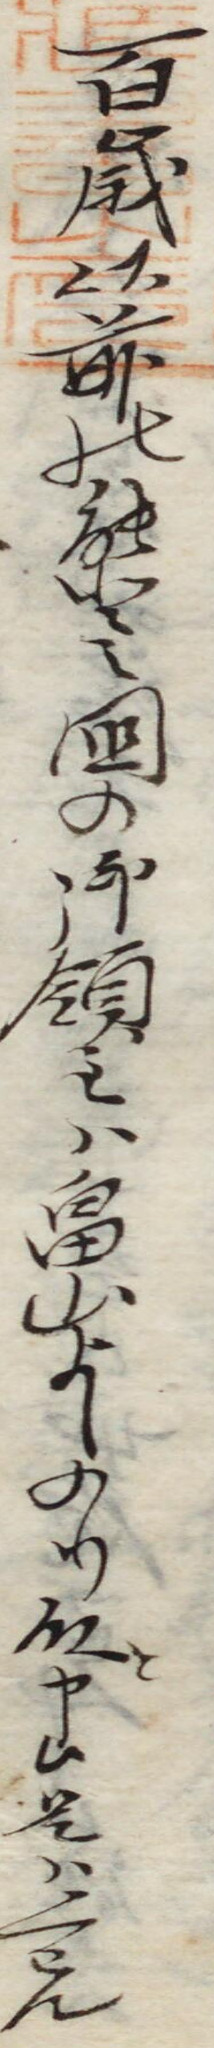百歳以前の能登之国の御領主は畠山よしのり殿と申候是はくわん
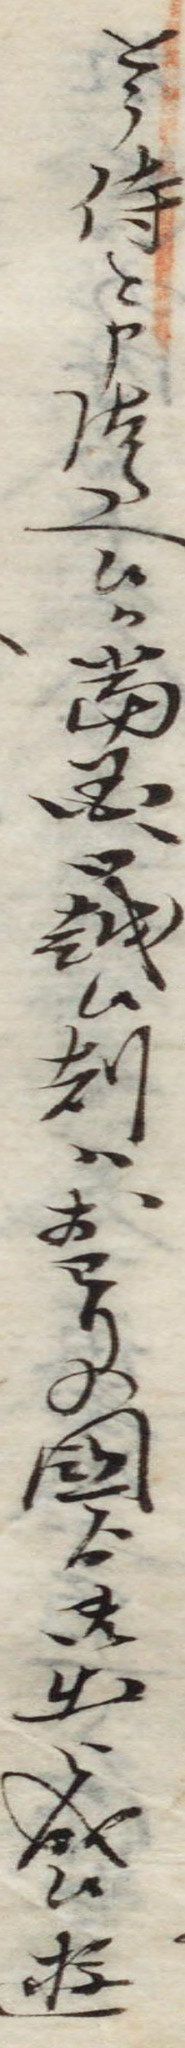とう侍と申つたへ候か当国へ御越候刻はおわりの国ゟ御出候成候遊
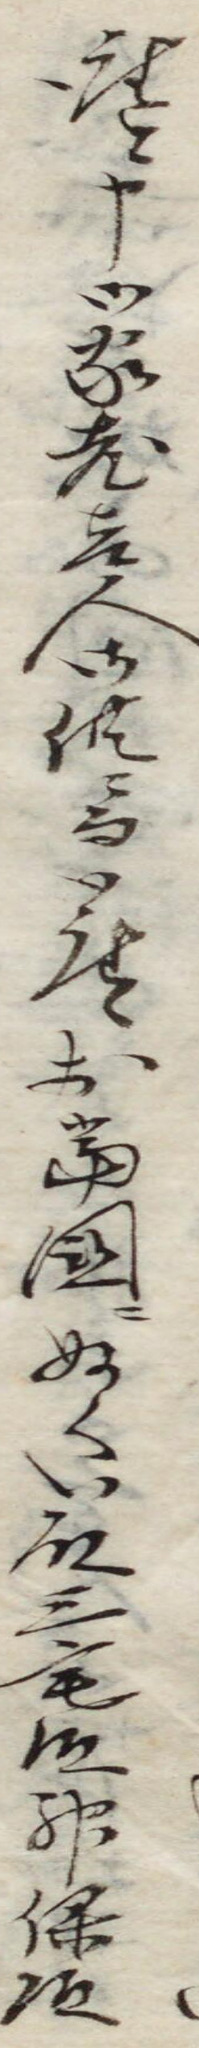座と申御家老壱人御供に而御座候於当国殿三宅殿神保殿
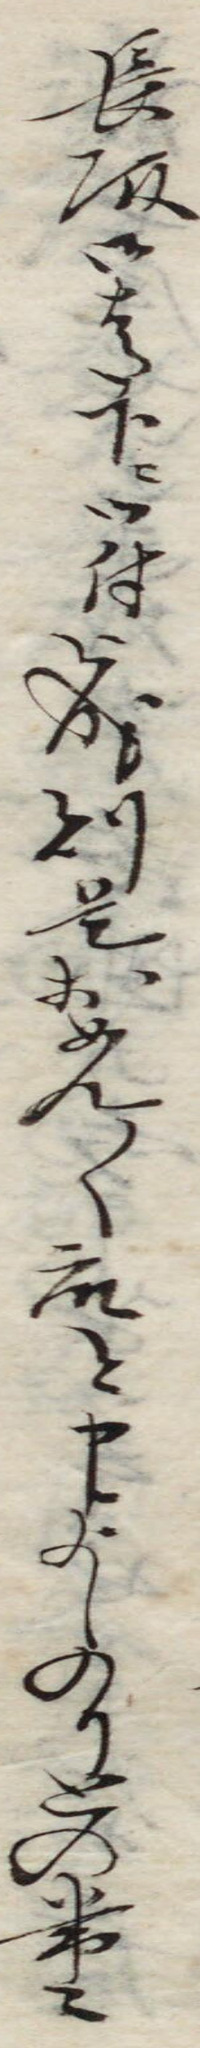長殿御はた下に御付被成候則是於めん〳〵衆と申候よしのりとの常々
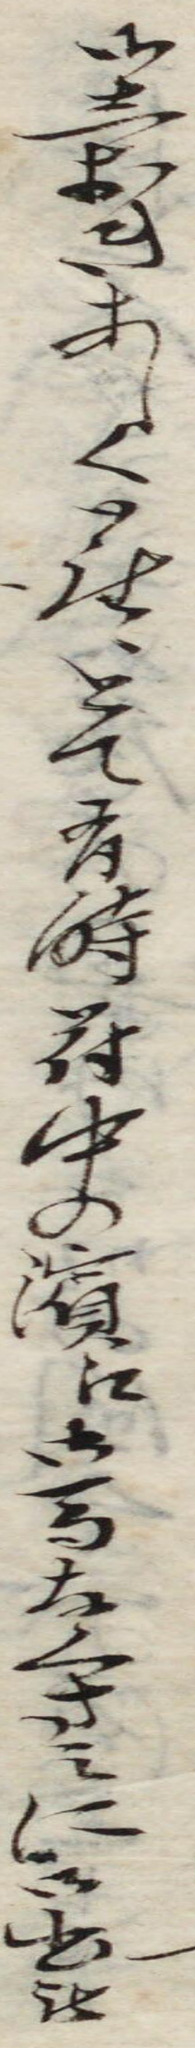御しおきあしく御座候とて有時府中の浜え御馬なくさみに御出被
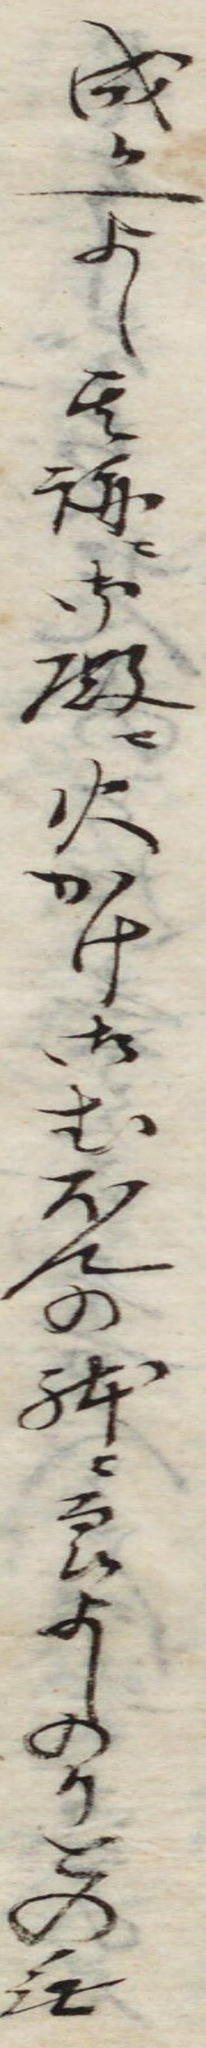成候へよし其跡に御殿に火かけ御むほんの躰に而候よしのりとの無
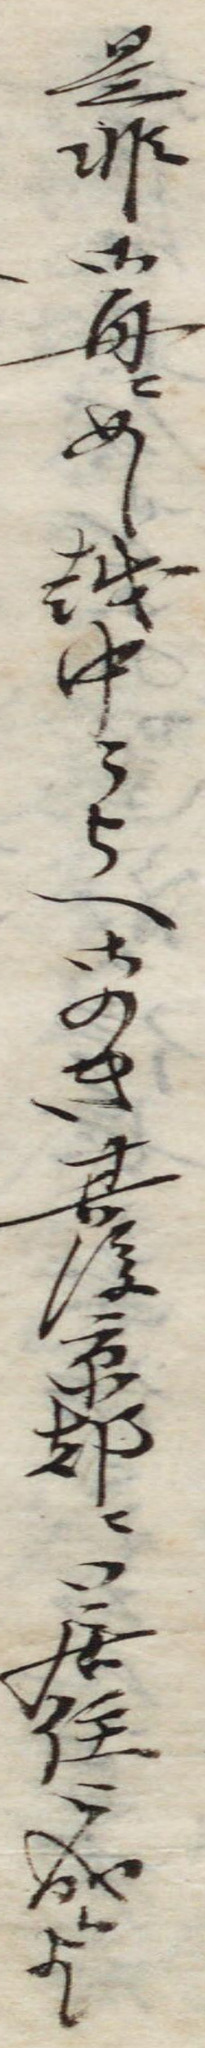是非御舟にめし越中うらへ御のき其後京都に御居住被成候よし
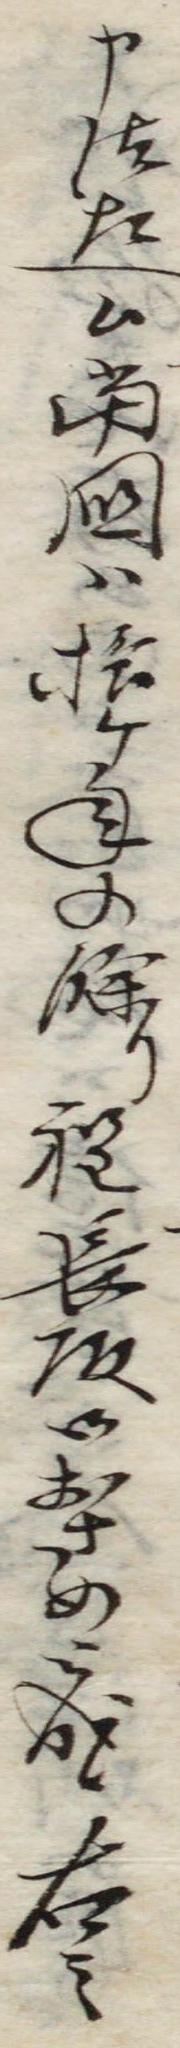申つたへ候当国は拾ヶ年の餘り程長殿御おさめ被成候右之
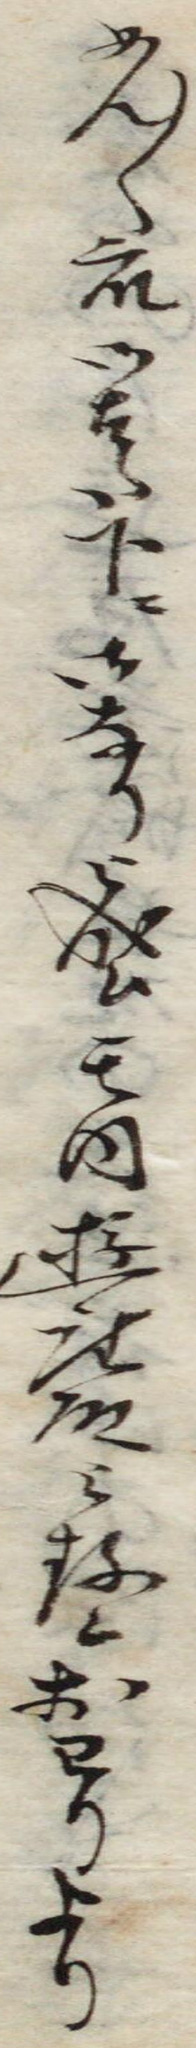めん〳〵衆御はた下に御なり被成候其内遊座殿被致候おわりより
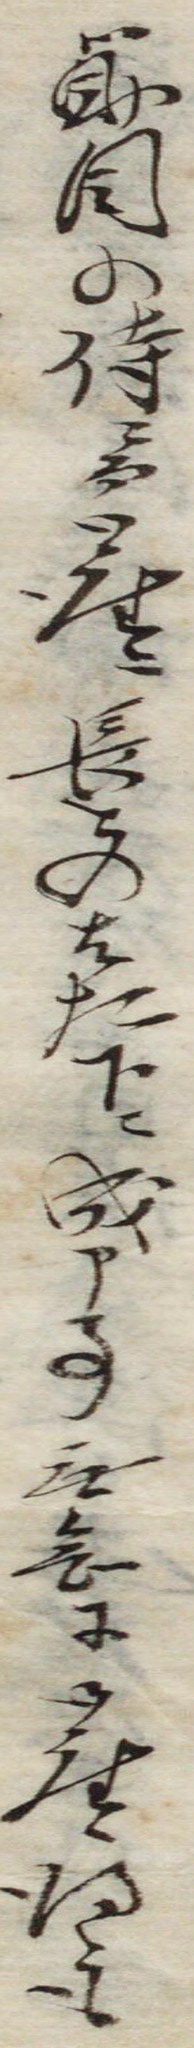筋目の侍に而御座候長とのはた下に成申事無念に御座候得とも
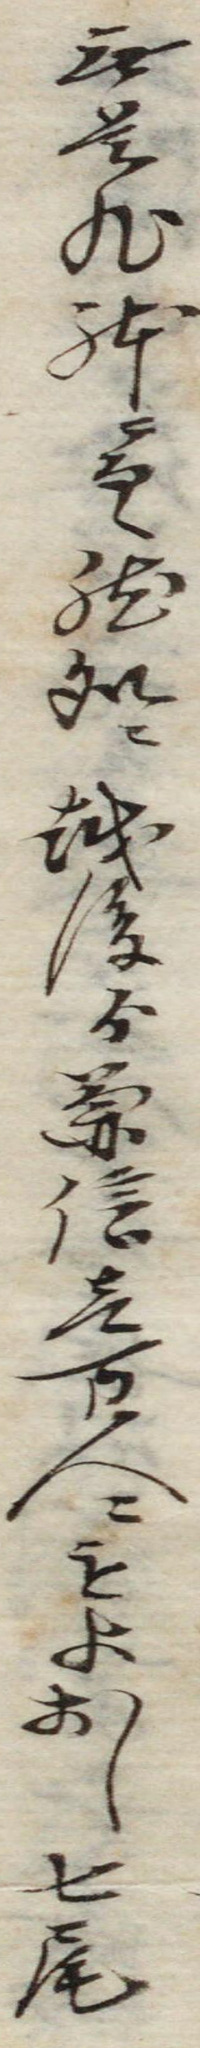無是非躰に而候然処に越後ゟ兼信壱万人にもよおし七尾

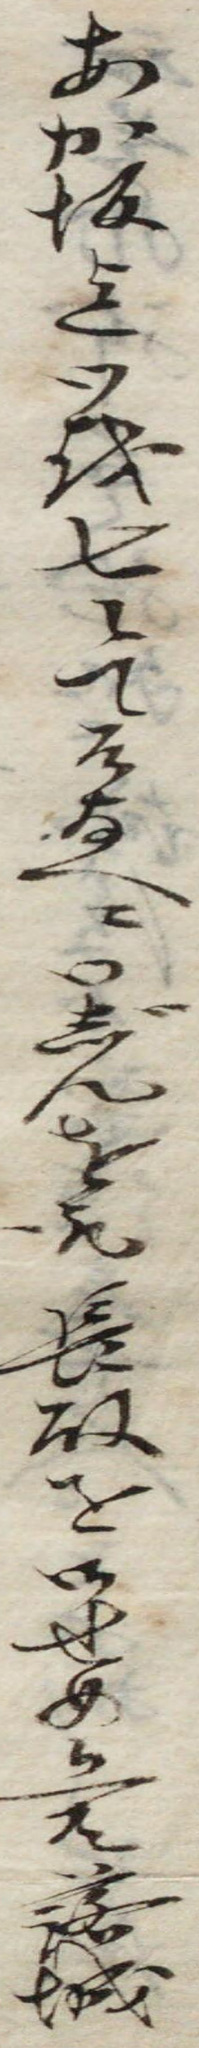あか坂迄御越七にてそなへに御じんを取長殿を御せめ候へ共落城
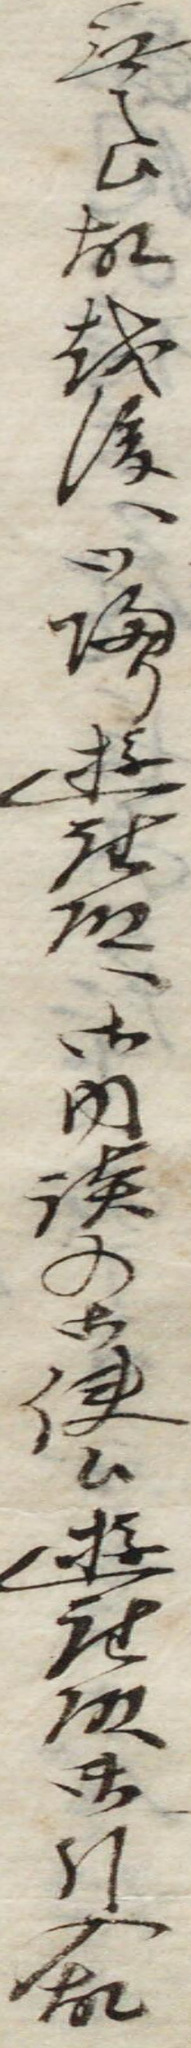無之候故越後へ御帰り遊座殿へ御内談の御使候遊座殿御引入故
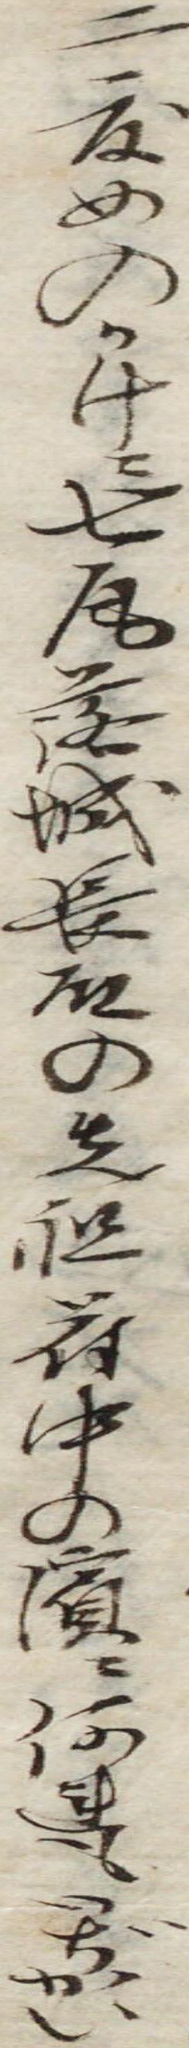二度めのかけに七尾落城長殿の先祖府中の浜に何れも御ぢかい
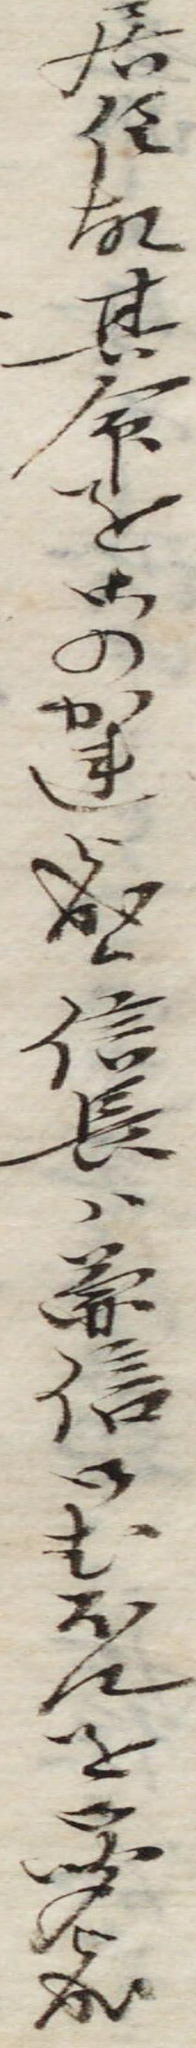居住故其命を御のかれ被成候信長は謙信御むほんを御聞被成
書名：古老紀談等
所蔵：Ishikawa Prefectural Library
